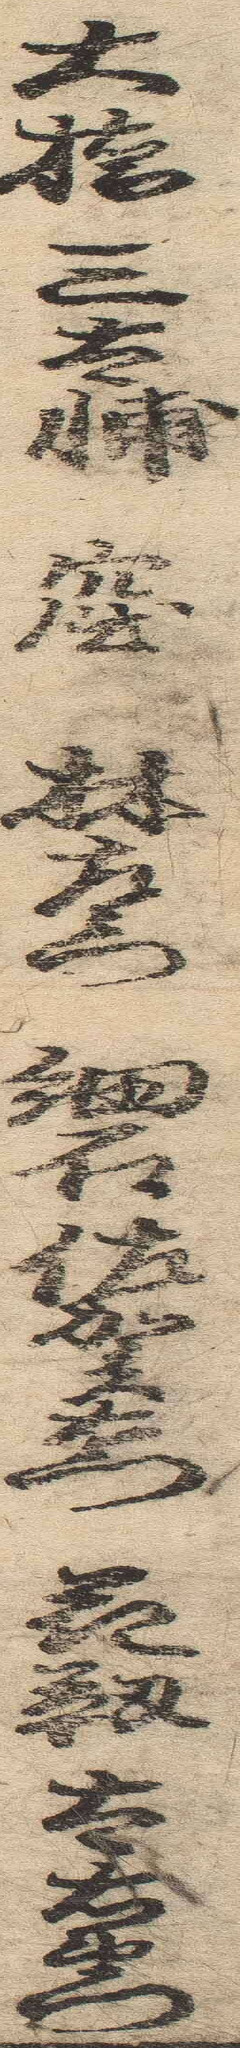大橋三太輔窟林左衛門細石佐賀右衛門花劔太右衛門
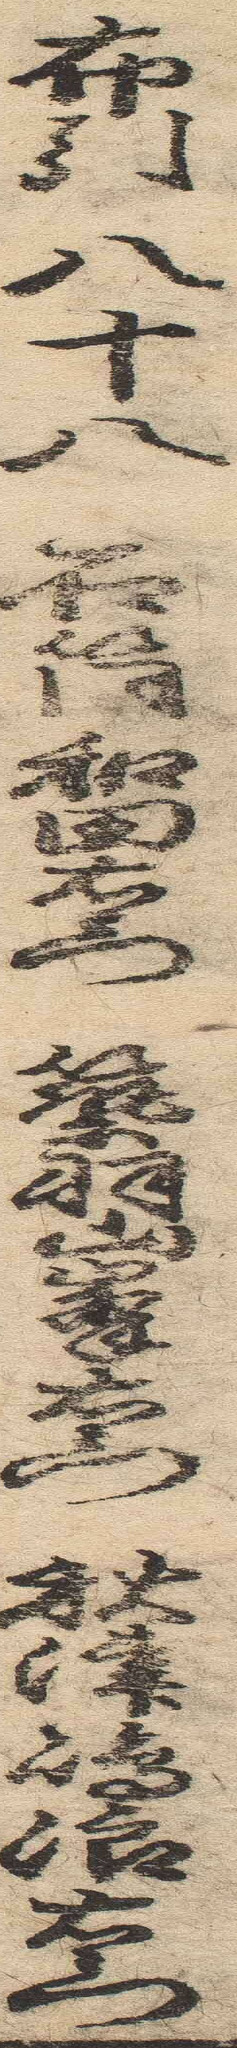布引八十八石筒和田右衛門築羽山峯右衛門秋津嶋浪右衛門
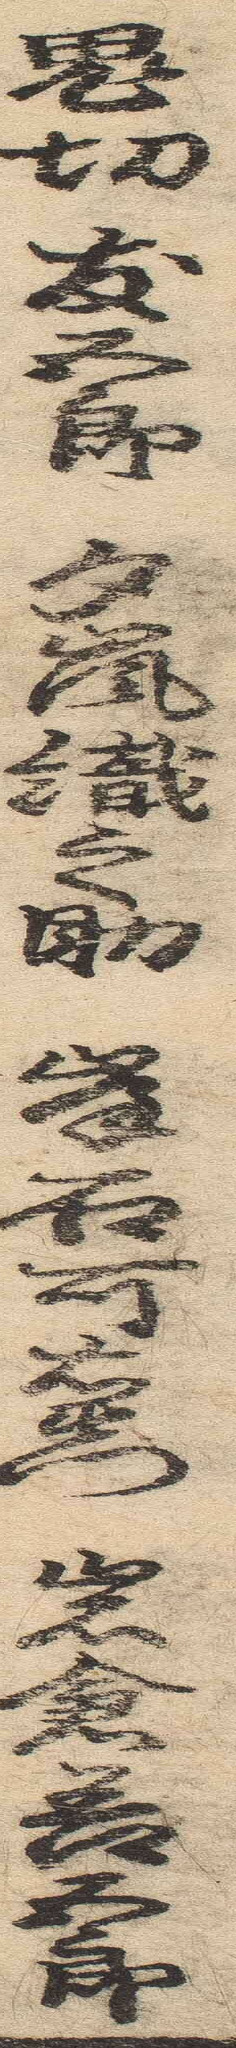鬼切友五郎夕嵐織之助峯石万右衛門岩倉善五郎
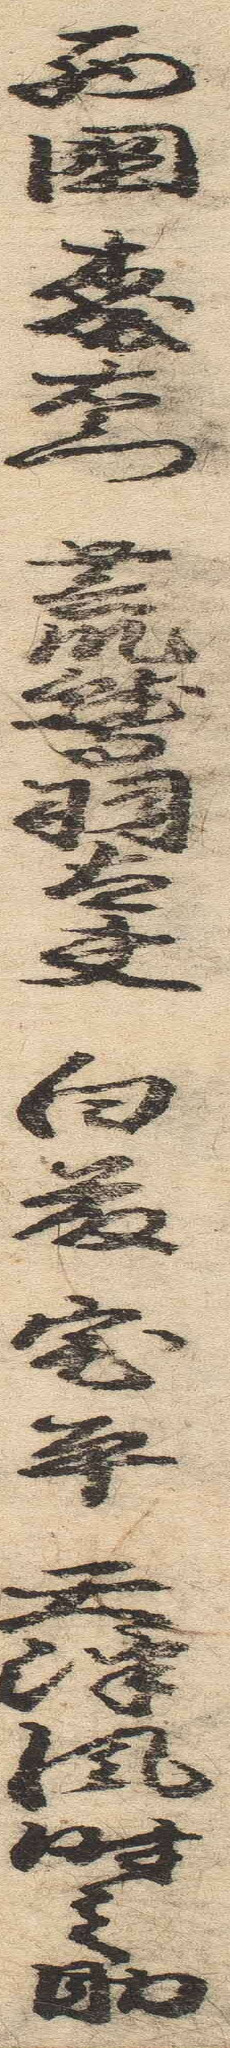両国森右衛門荒鷲羽太夫白藤宅平天津風時之助
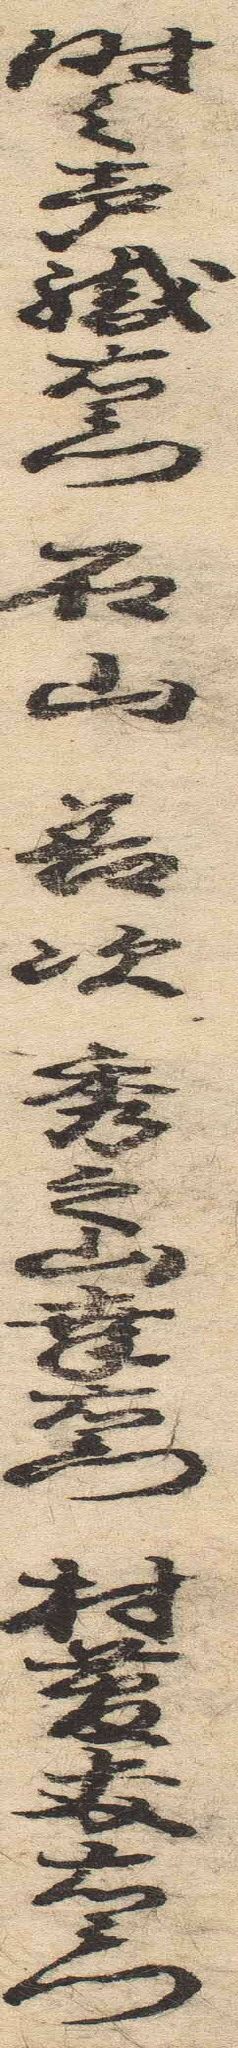時之声織右衛門石山善次秀之山幸右衛門村藤森右衛門
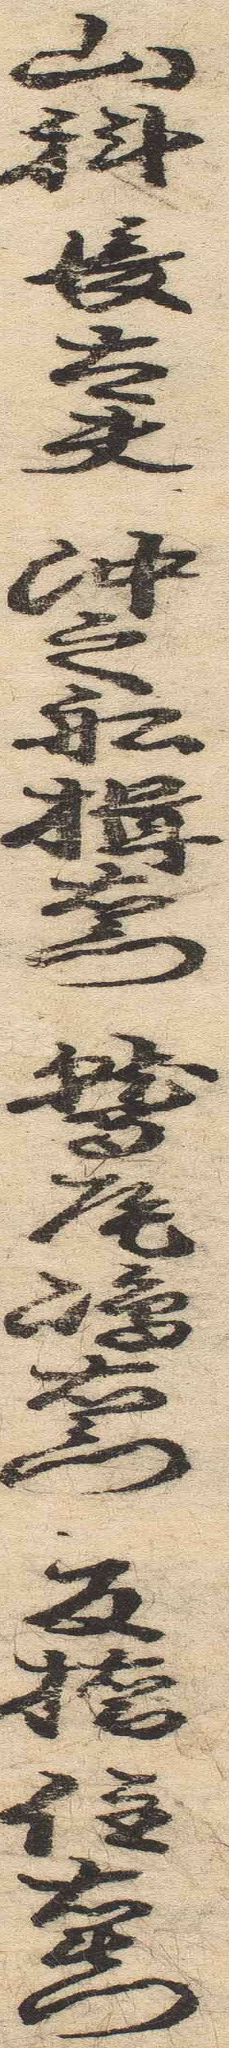山科長太夫沖之船輯右衛門鷲尾嶋右衛門反橋住右衛門
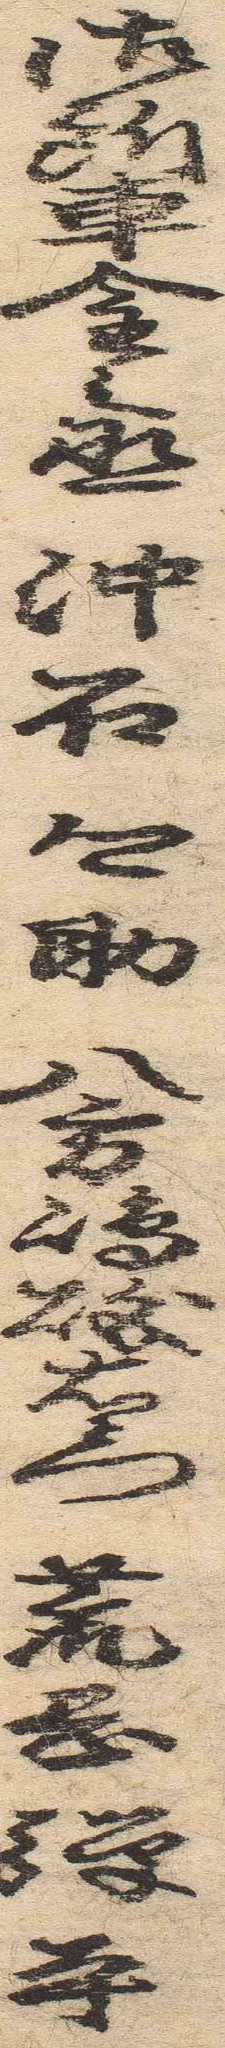御所車金之丞沖石今助八方嶋磯右衛門荒岡弾平
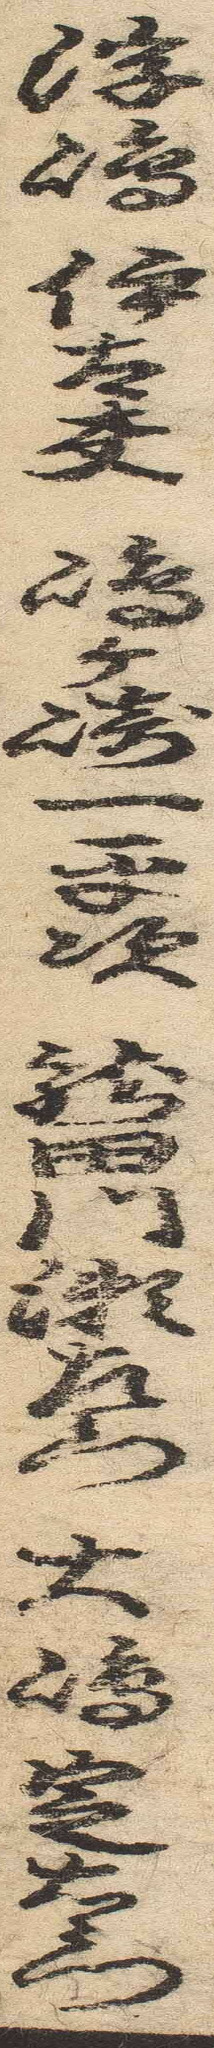浮嶋伊太夫嶋ケ崎一平次龍田川瀬左衛門大嶋定右衛門
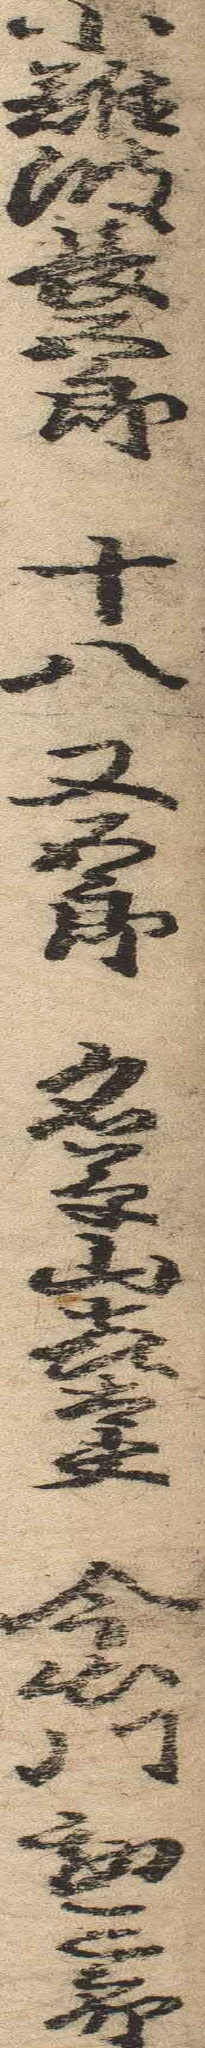小難波長五郎十八又五郎名草山喜太夫今出川勘三郎
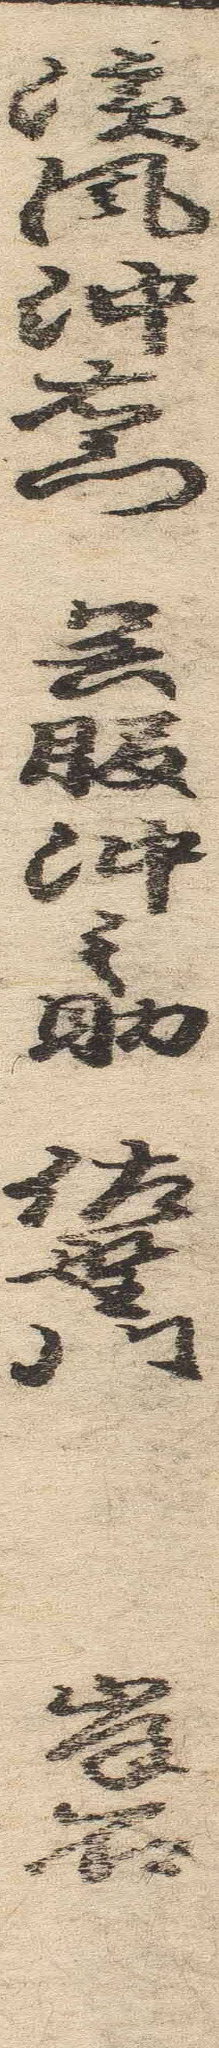浜風沖右衛門呉服沖之助佐野川峯石
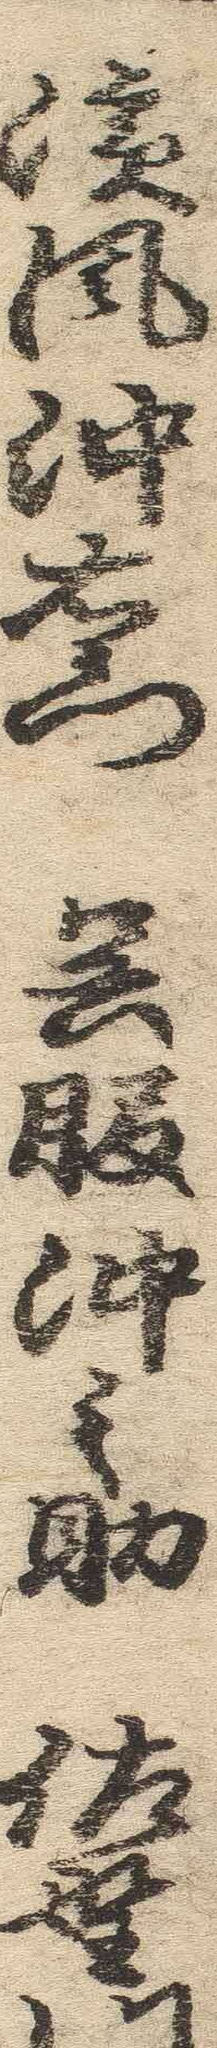浜風沖右衛門呉服沖之助佐野川峯石
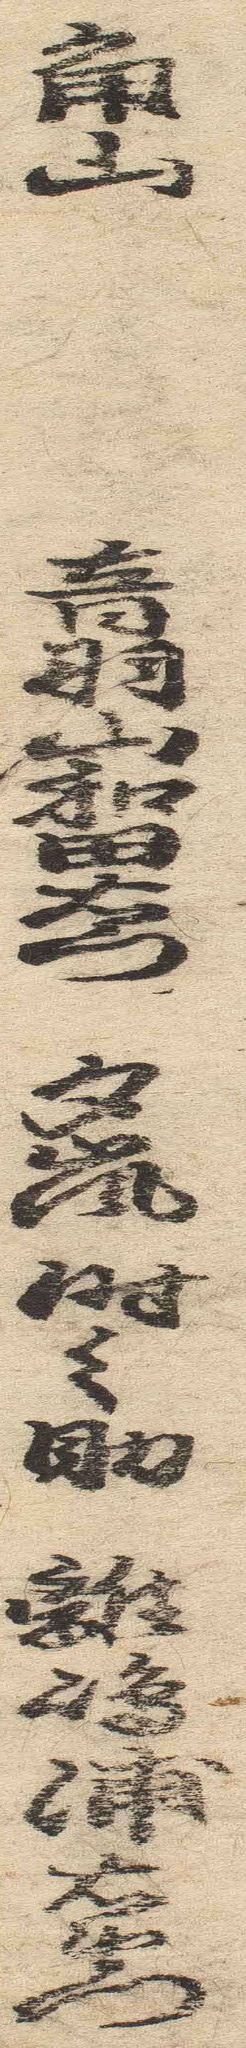角山音羽山和田右衛門夕嵐時之助離嶋浦右衛門
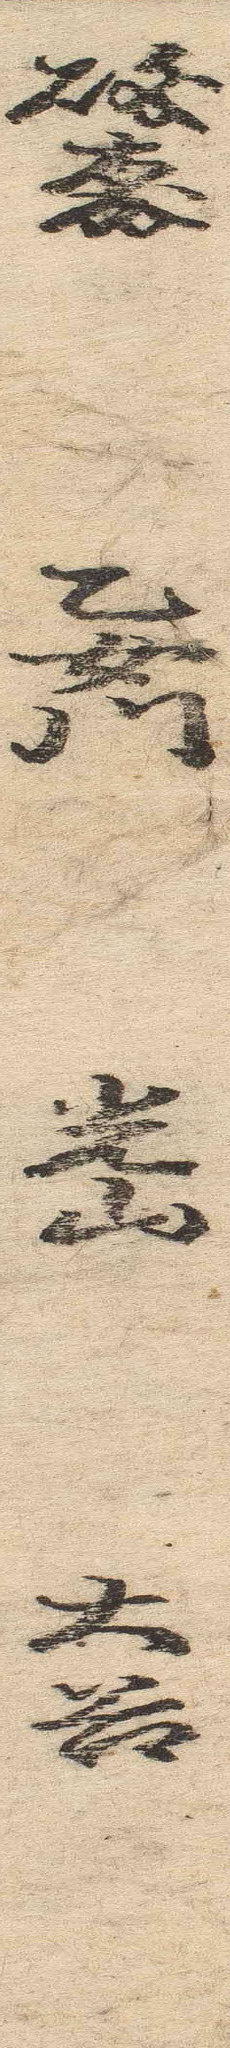磯森乙女川光山大谷
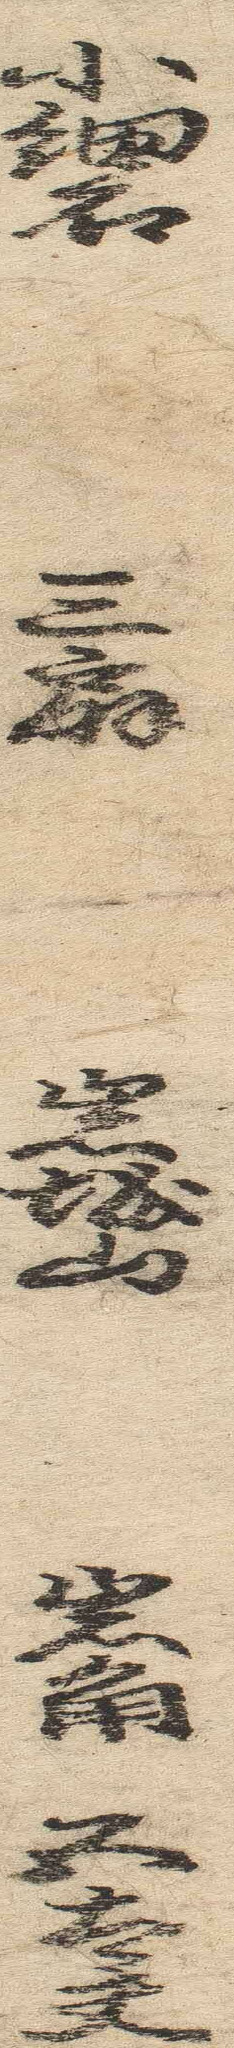小細名三扇岩城山岩角五太夫
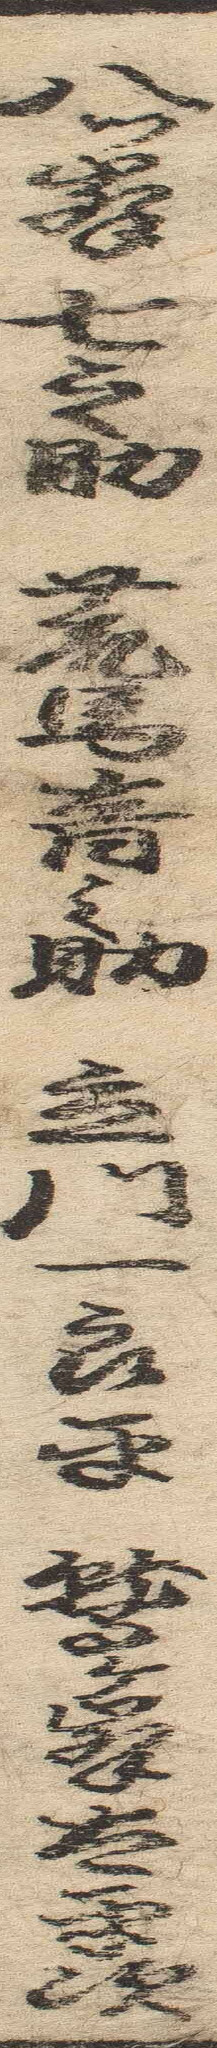八峯七之助荒馬音之助立川一良平鷲ケ峯太平次
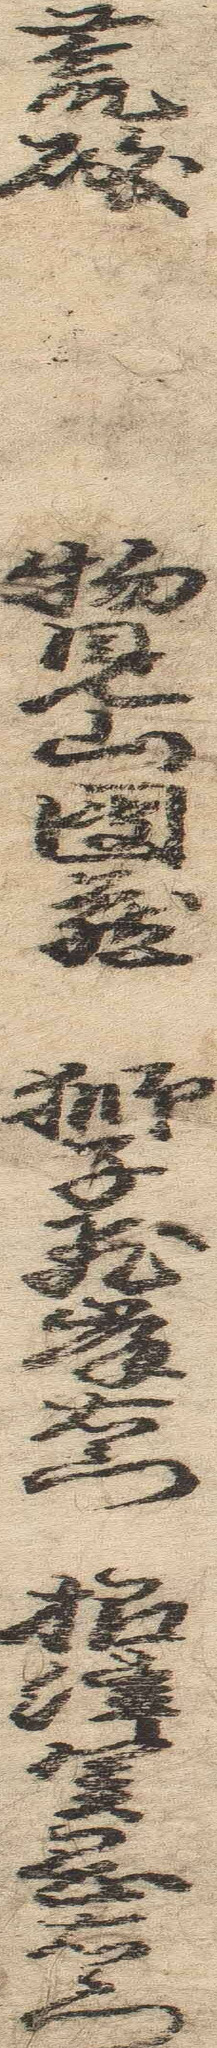荒磯物見山団蔵獅子蔵峯右衛門招沢関岡右衛門
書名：古今相撲大全
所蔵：東京学芸大学附属図書館 国文学研究資料館
